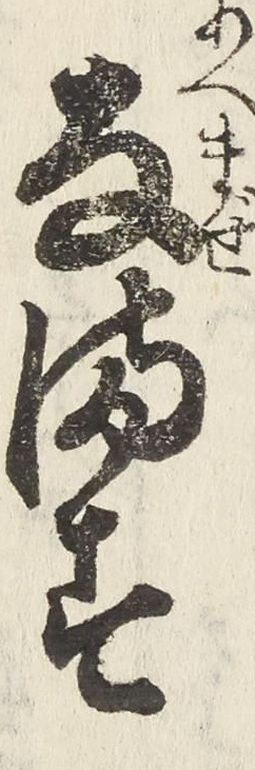なます
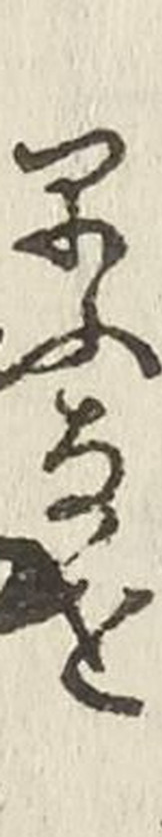早ふなを
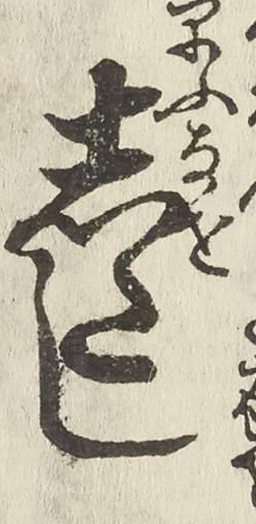したし

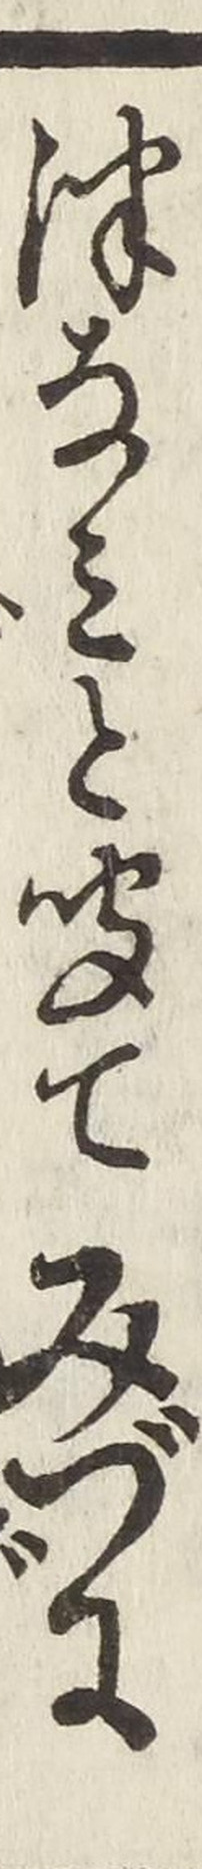津なみと聞てみづに
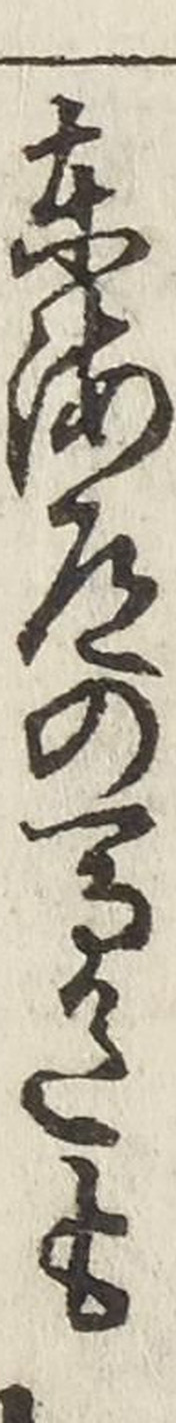東海道の馬かたも
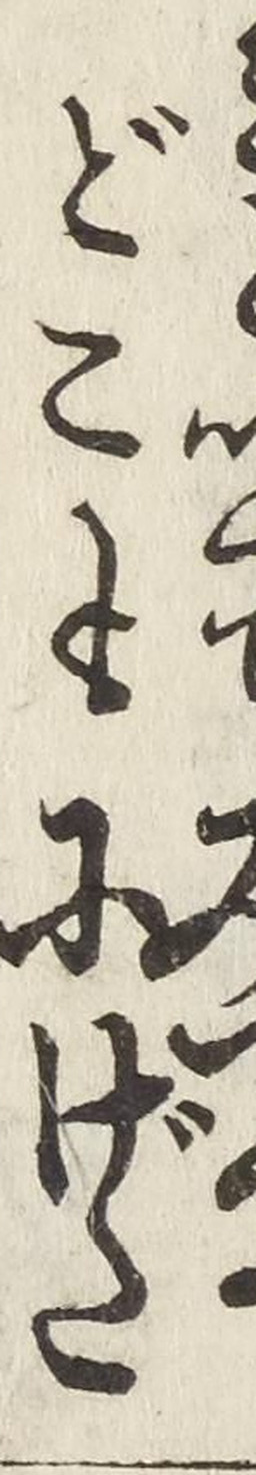どこもにげた
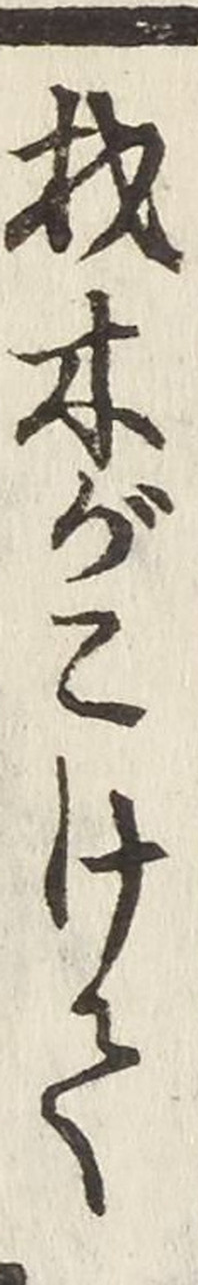材木がこけて
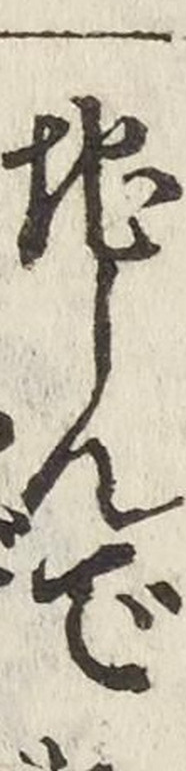地しんで
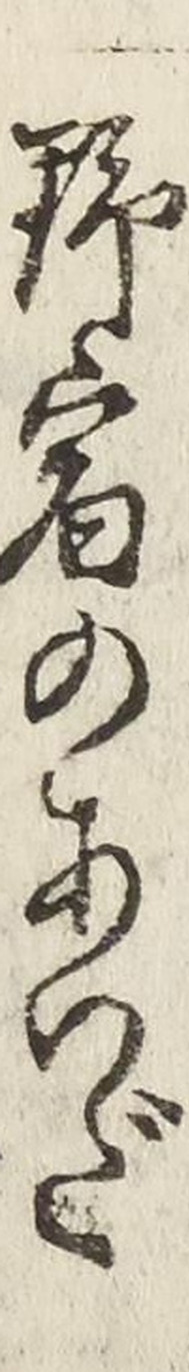野宿のあいだ
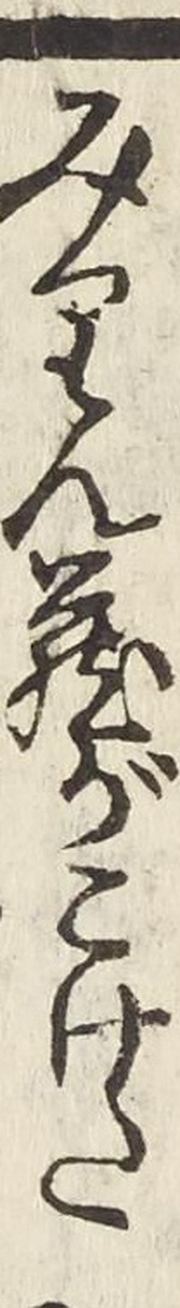みりん蔵がこけた
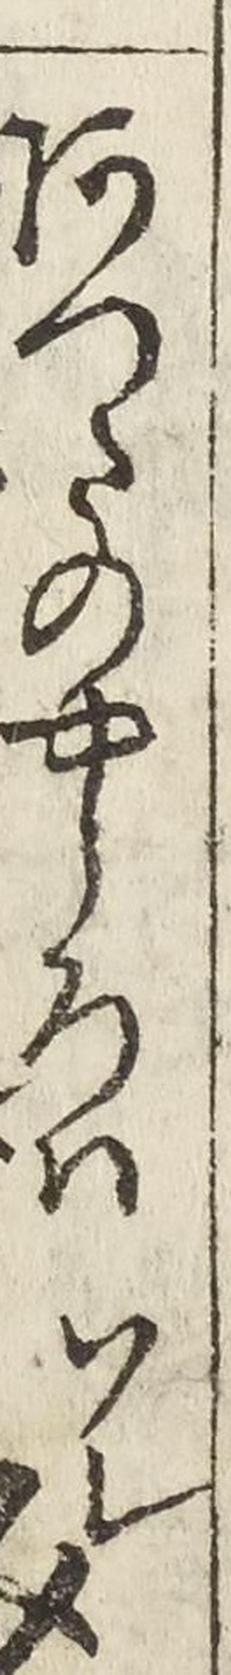あつたのやしろはソレ
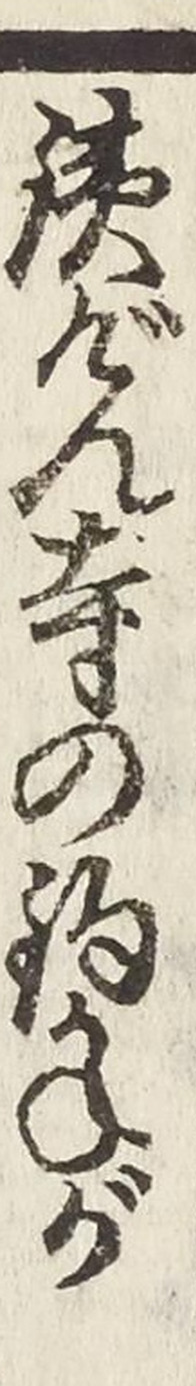鉄げん寺の釣かねが
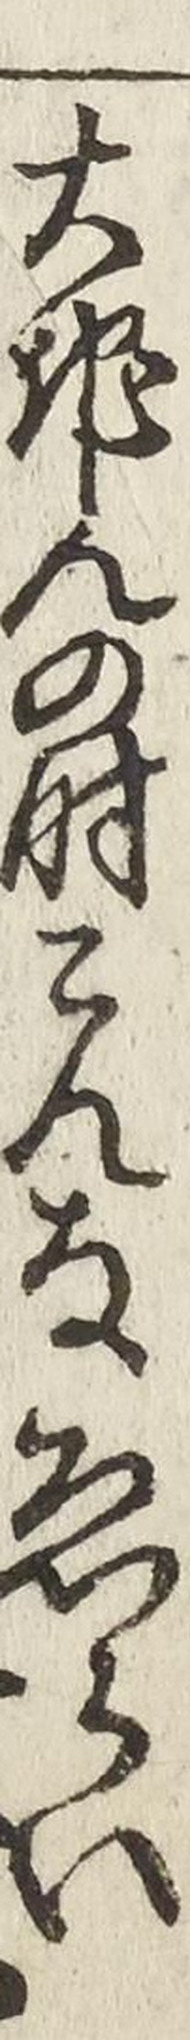大地しんの時こんなゑらい
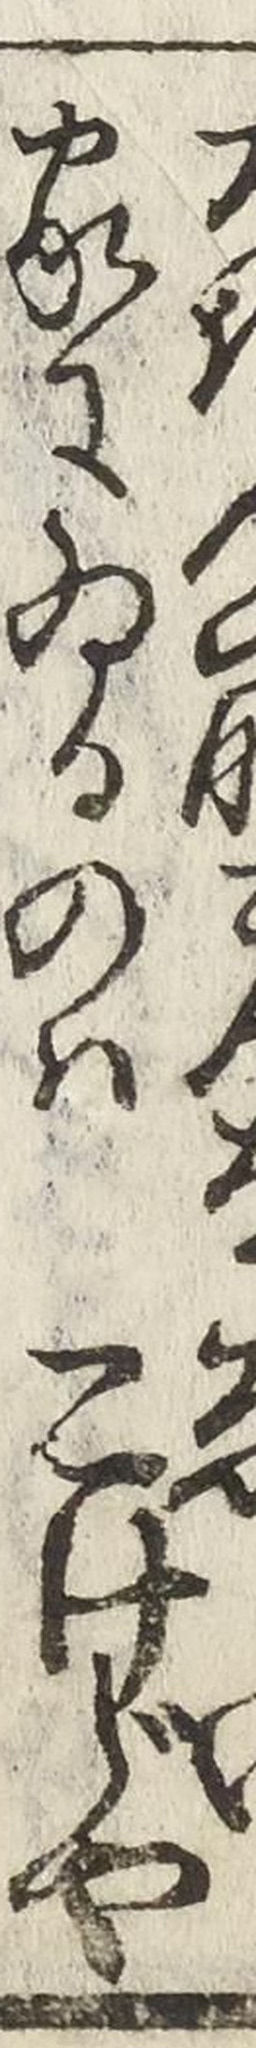家にゐるのはこけじや
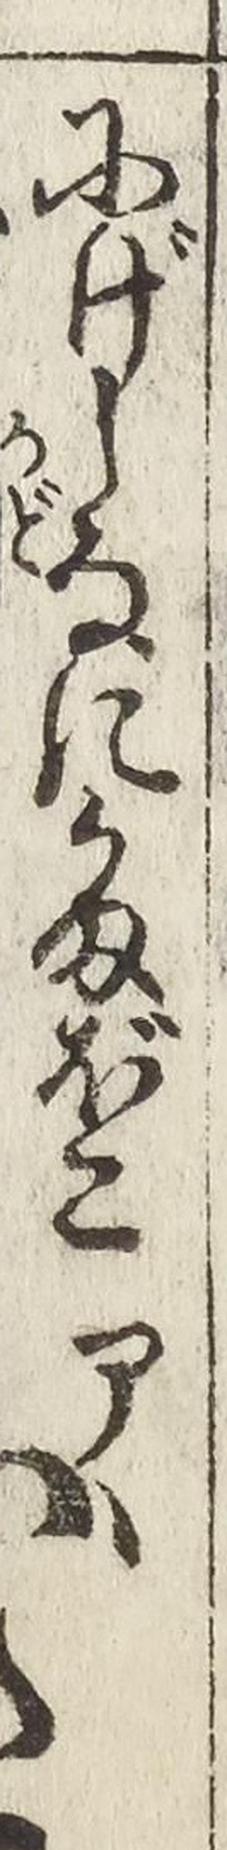にげしなにかまぼこアヽ
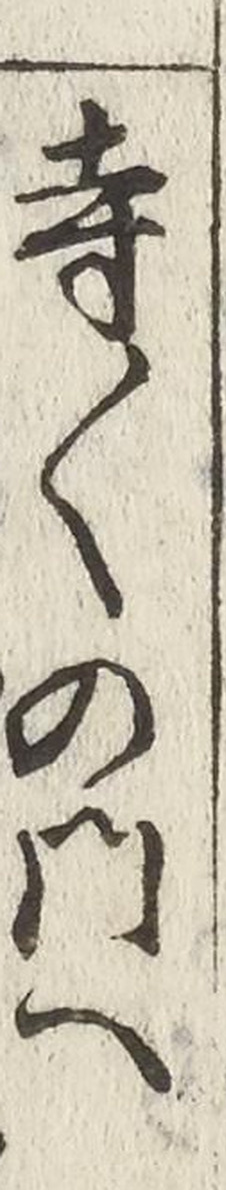寺〳〵の門へ
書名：大地震大津浪末代噺種　（二編　全）
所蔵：東京大学地震研究所図書室 Earthquake Research Institute Library, The University of Tokyo, JAPAN
